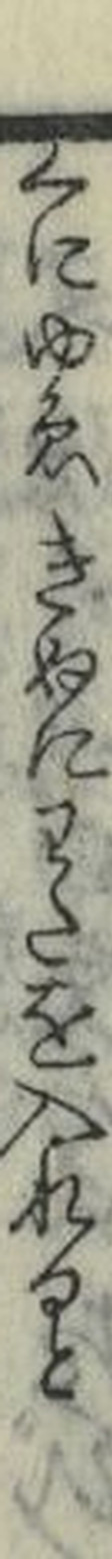くにゆゑきぬにわたを入れると
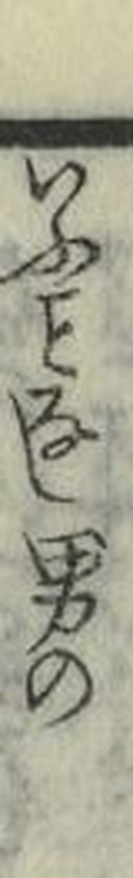いふことなし男の
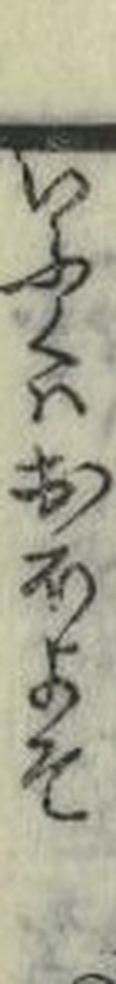いふくハおほよそ
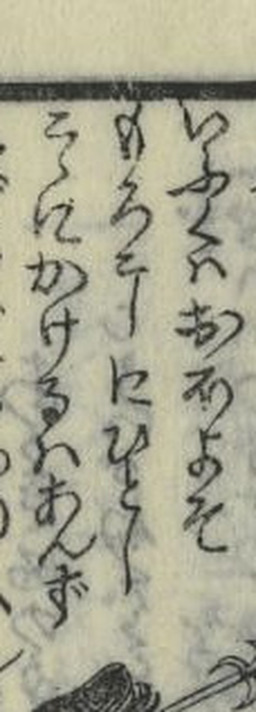もろこしにひとし
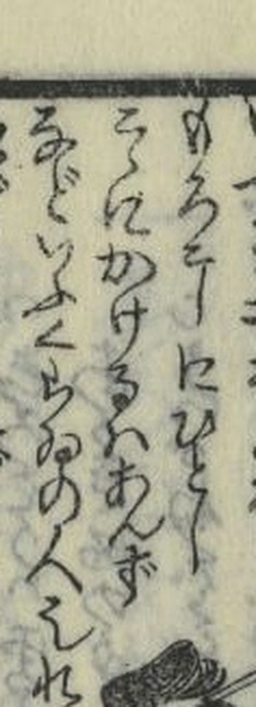こゝにかけるハあんず
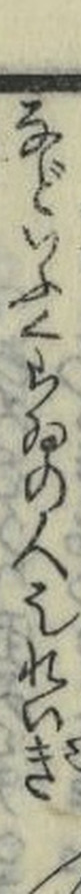などいふくらゐの人也れいき
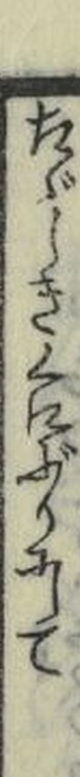たゞしきくにぶりにして
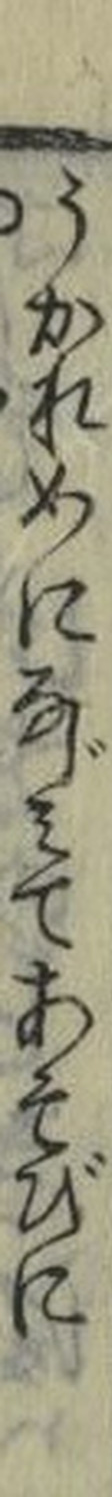うかれめになじミてあそびに
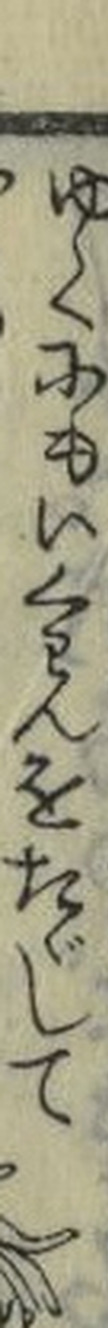ゆくにもくわんをたゞして
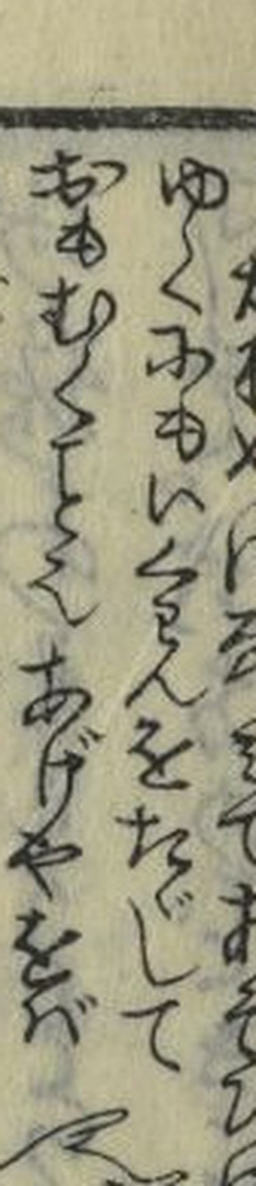おもむくこと也あげやをバ
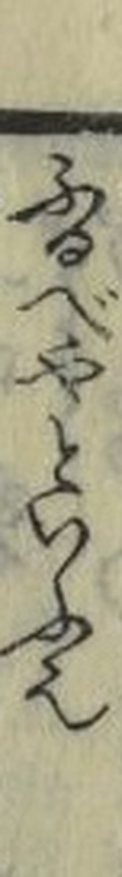ふるべやといふ也
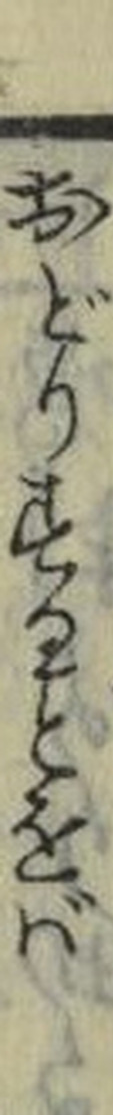おどりすることをバ
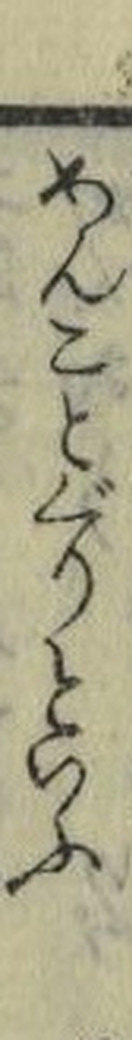めんことぐりといふ
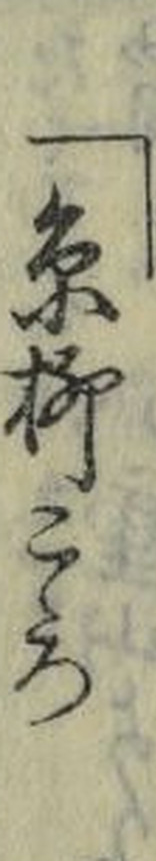〽糸柳こゝろ
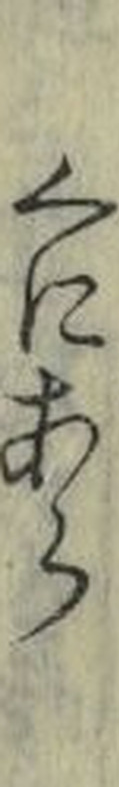くにあら
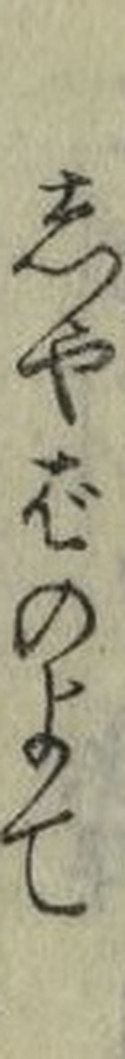しやばのよて
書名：琉球奇譚
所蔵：University of the Ryukyus Library
